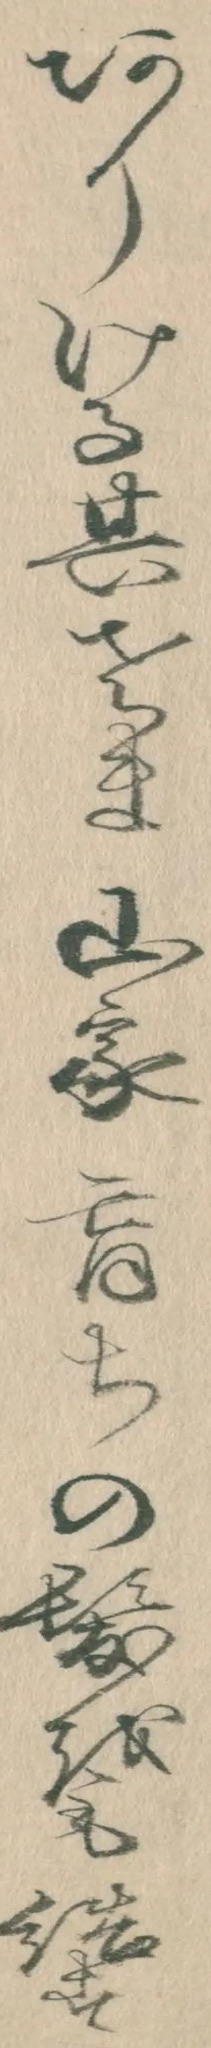ありける其さま山家育ちの髪をも結す
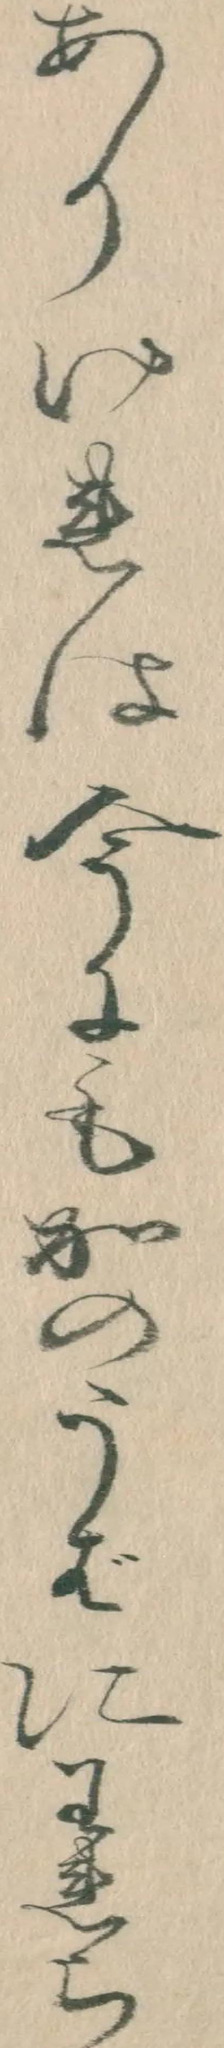ありけれは今にもかのうばにわれら
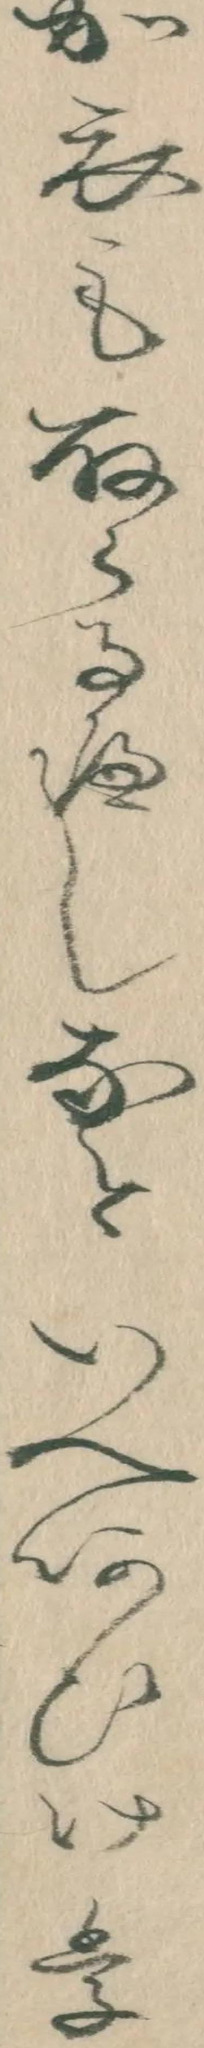か衣も取らるへしなといへあひけり

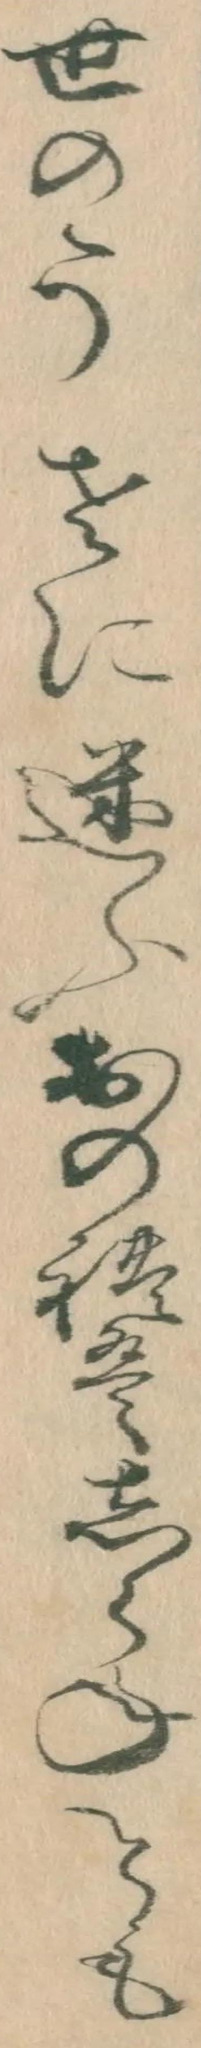世のうさに迷ふおのれはしらねとも
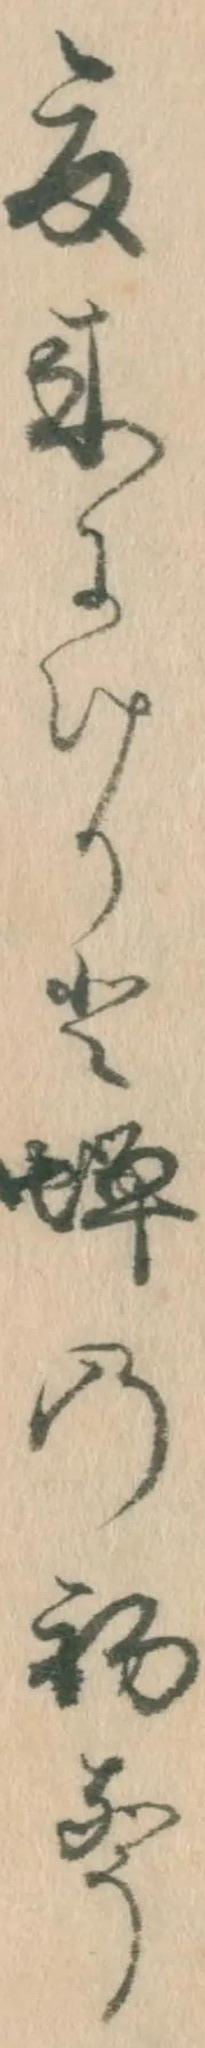夏来にけりと蝉の初聲
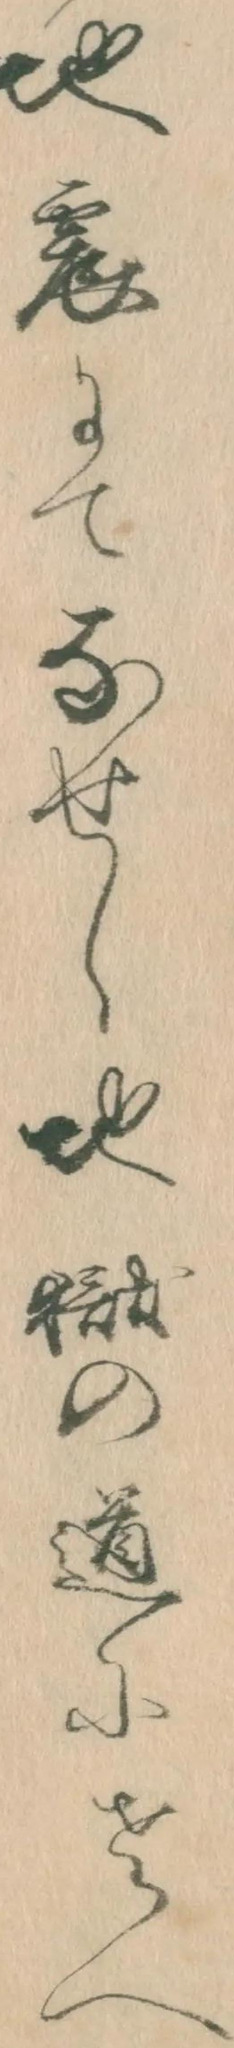地震にてなせし地獄の道にさへ
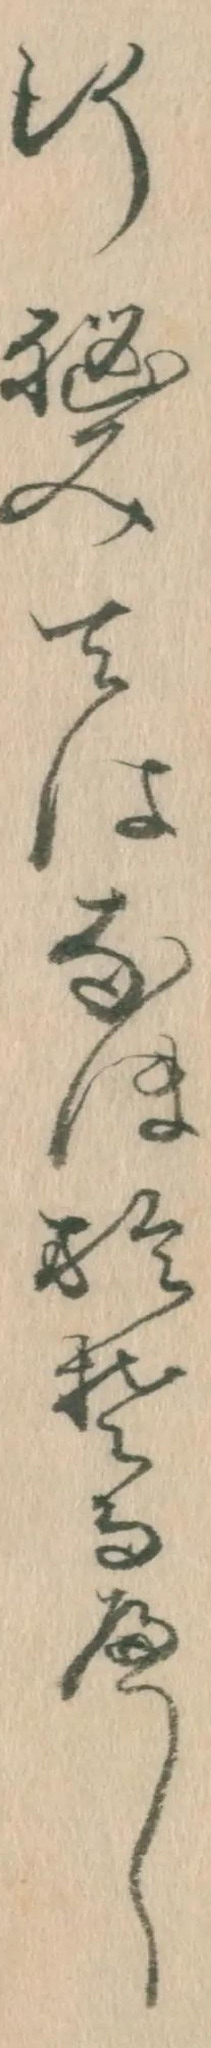行悩みてはなほおそるへし
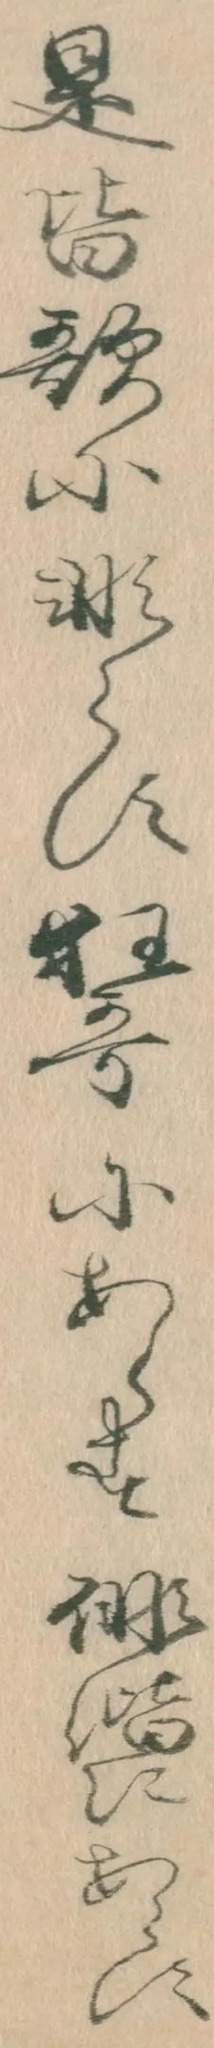是皆歌に非らす狂歌にあらす俳諧にあらす
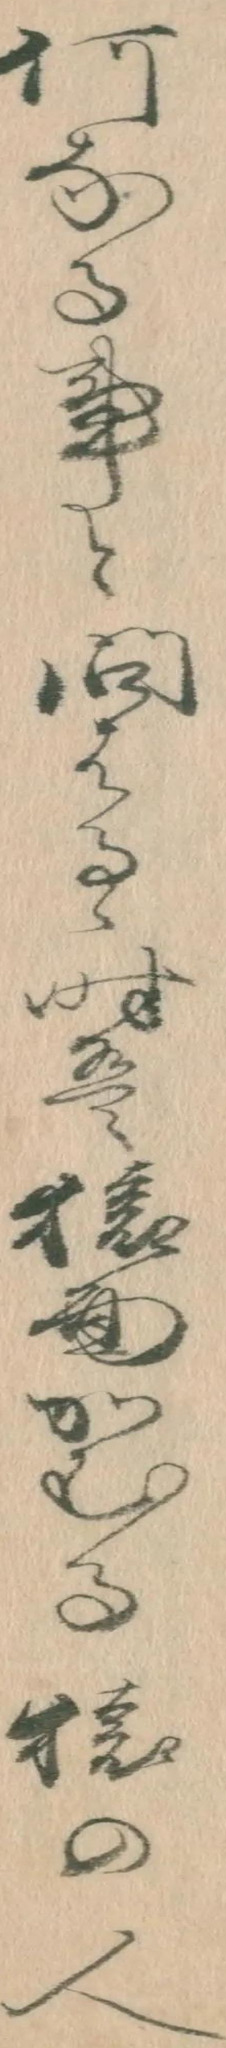何なる事と問はるゝ時は猿面かむる猿の人
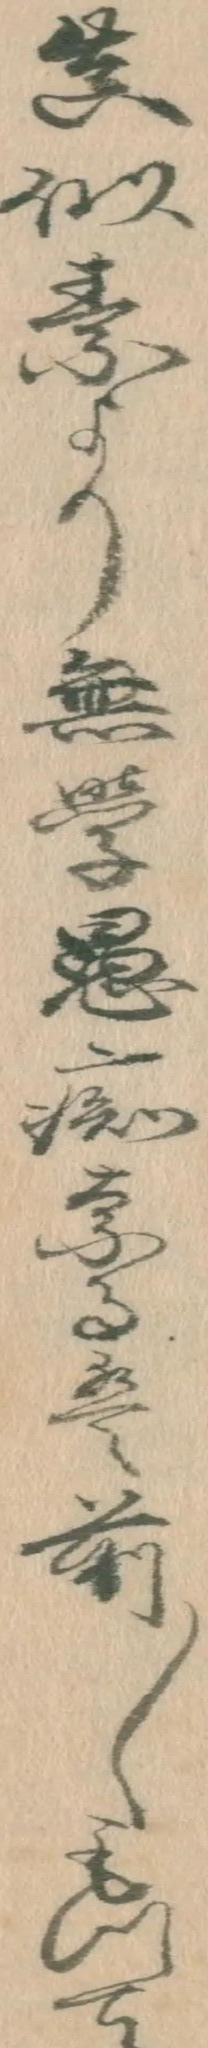真似素より無学愚痴なるは前〳〵もつて
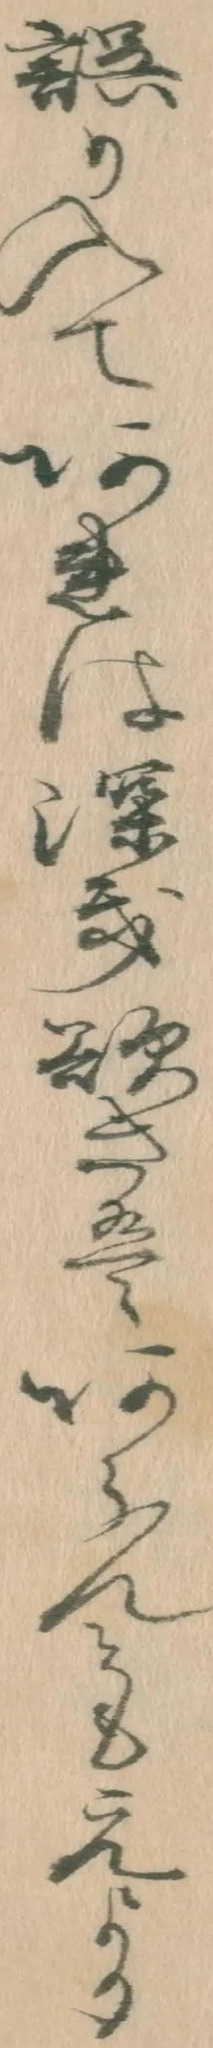誤り入てあれは深き歎きはあらんとも元より
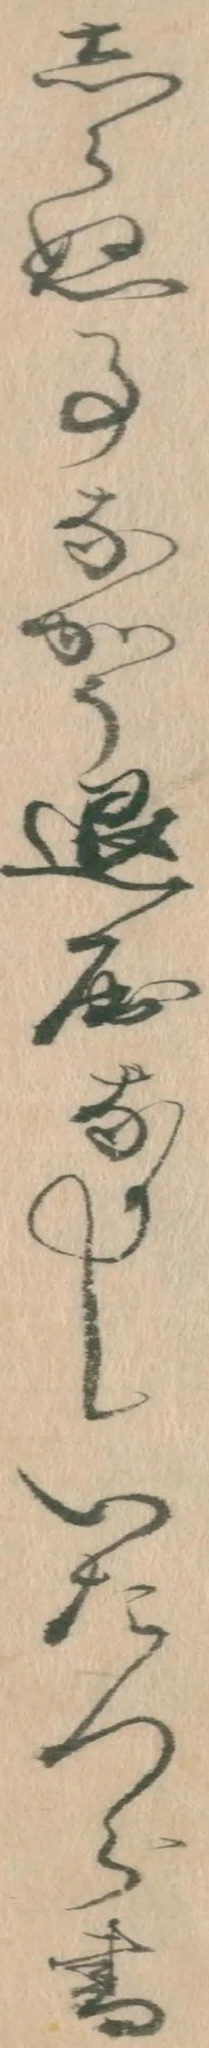しらぬ事ながら退屈なりしいたつら書
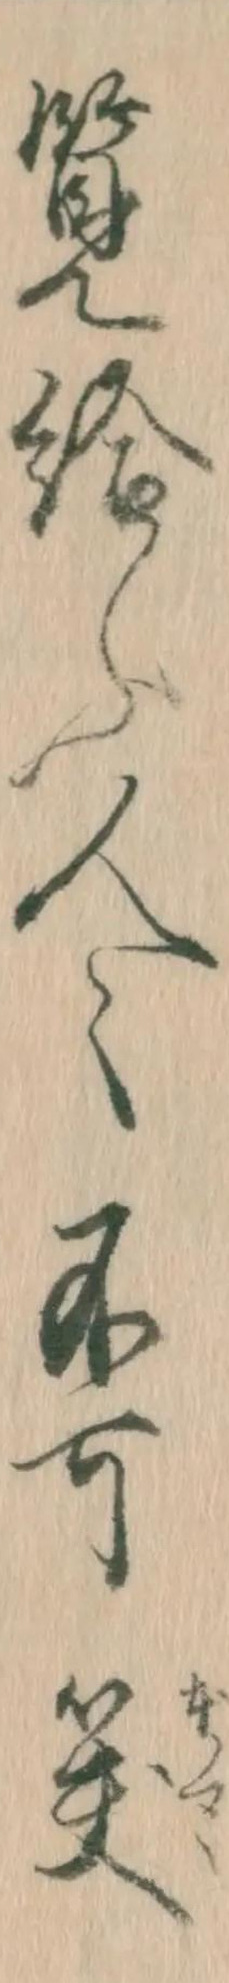覧給ふ人〻不可笑

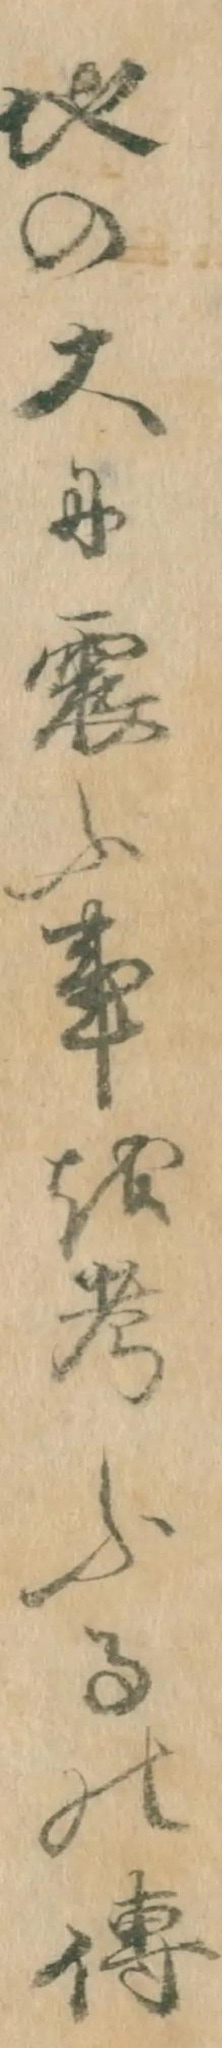地の大に震ふ事を考ふるの伝
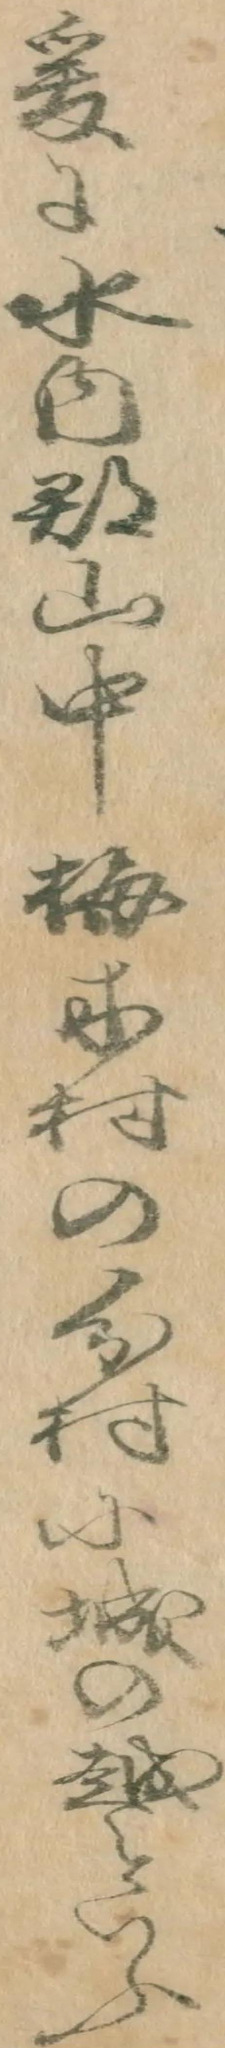爰に水内郡山中梅木村の分村に城の越といふ
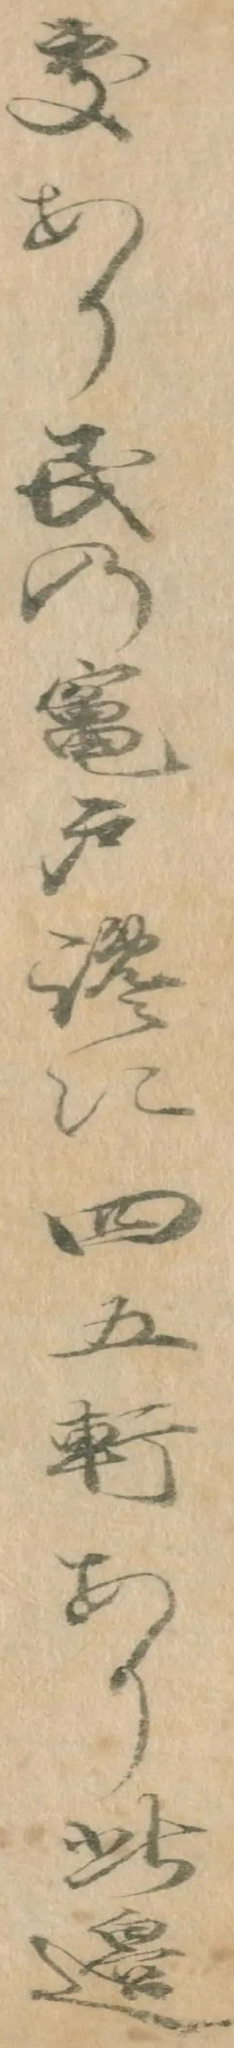処あり民の竃戸讒に四五軒あり此辺
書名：俗語之種. [6]
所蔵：国立国会図書館 National Diet Library, JAPAN
